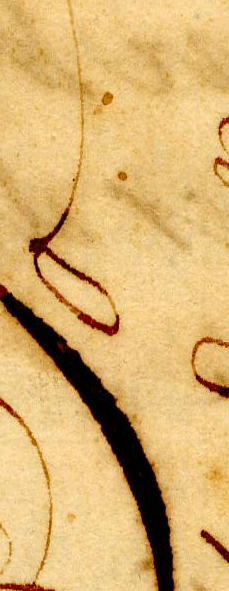T0
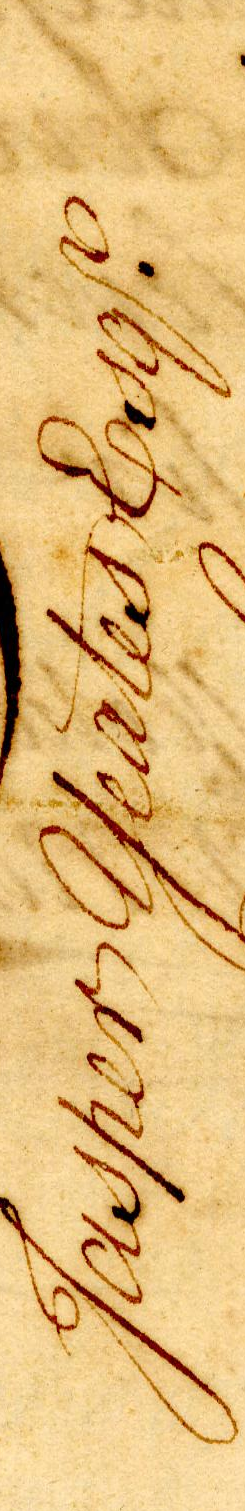Jasper Yeates Esq^r.
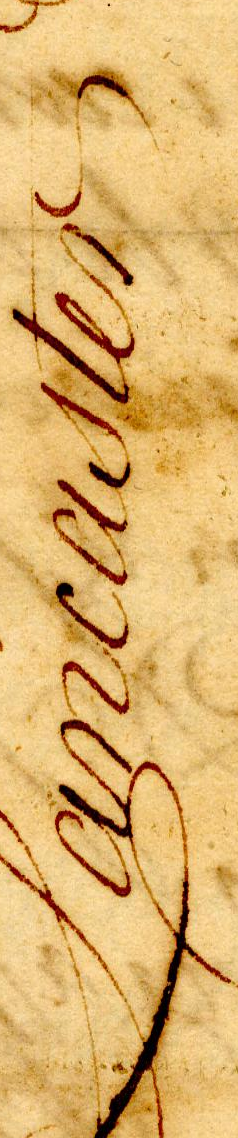Lancaster
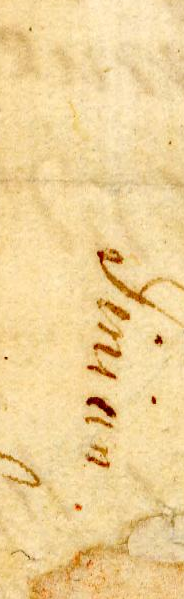Tinian
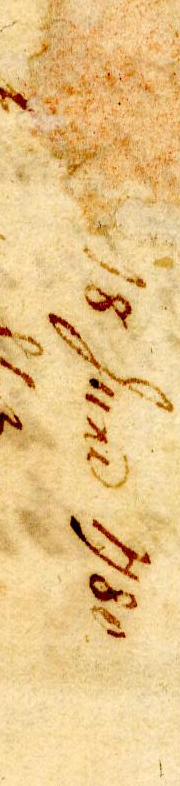18 June 1780
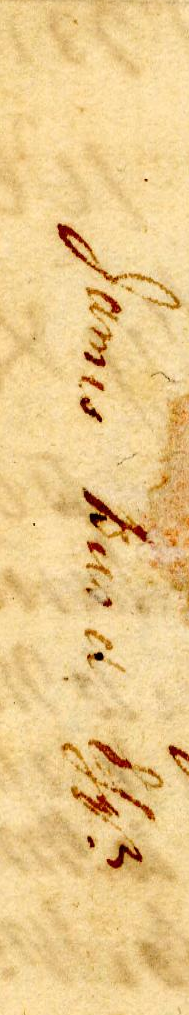James Burd Esq^r.
